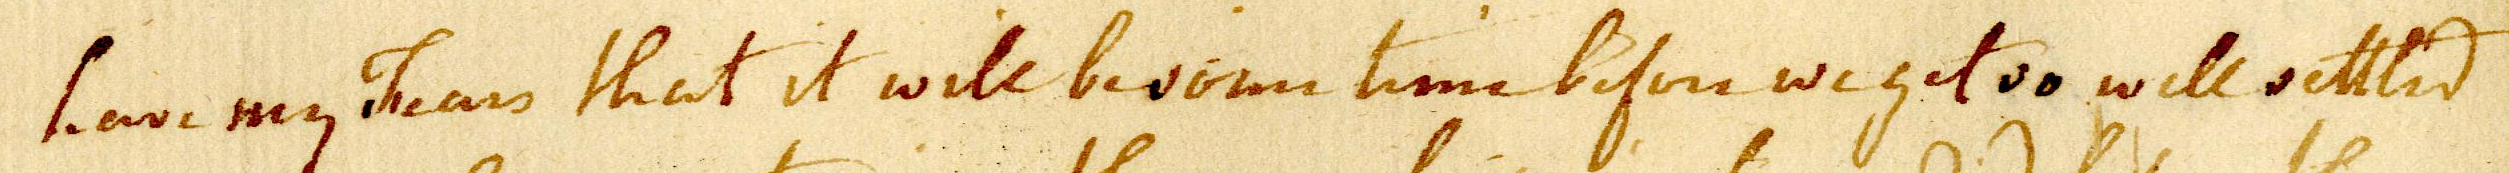have my Fears that it will be some time before we get so well settled
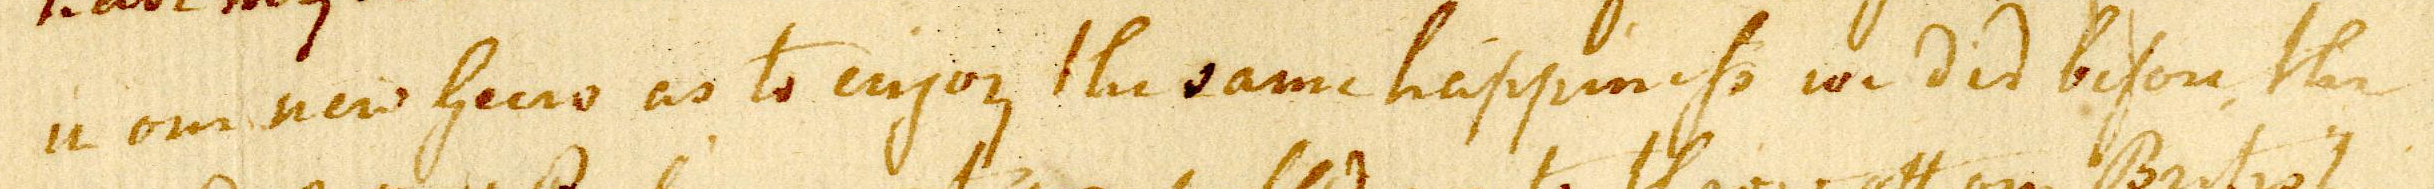in our new Years as to enjoy the same happiness we did before the
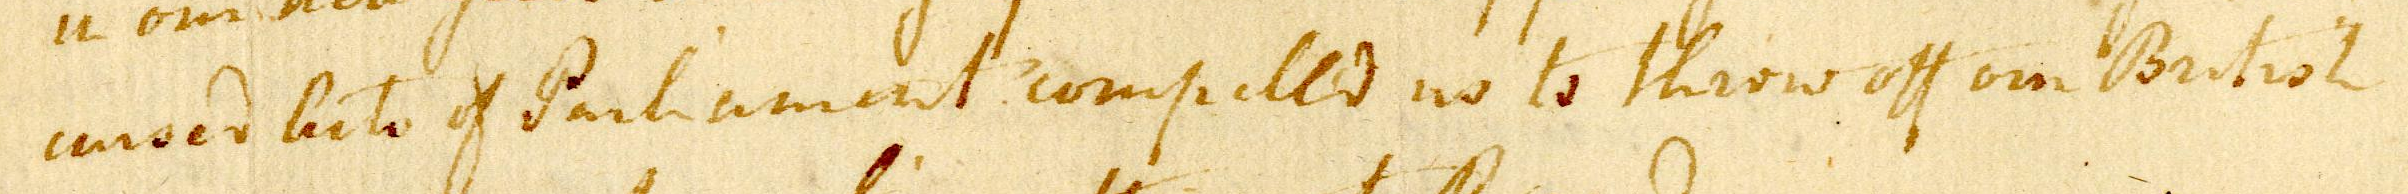cursed bets of Parliament compell'd us to throw off our British
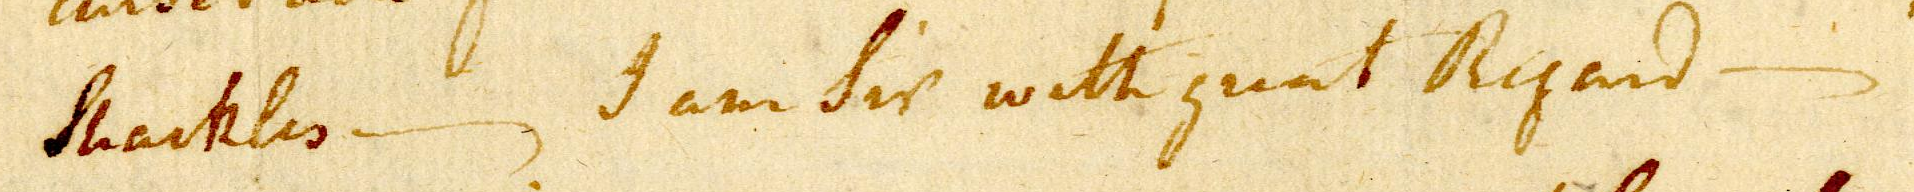Shackles. I am Sir with great Regard,
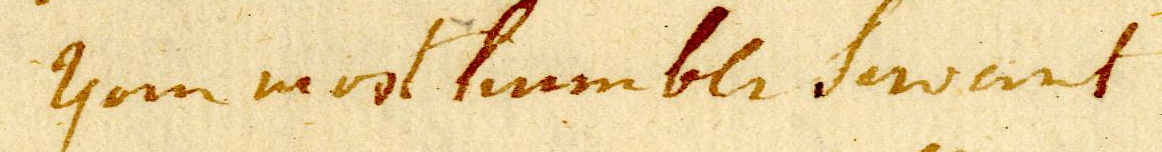Your most humble Servant
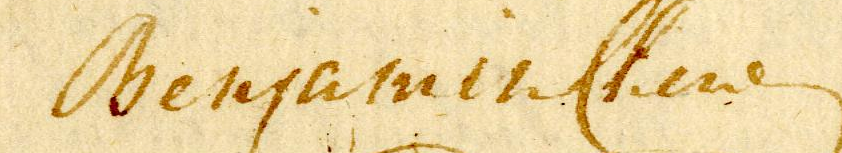Benjamin Chew
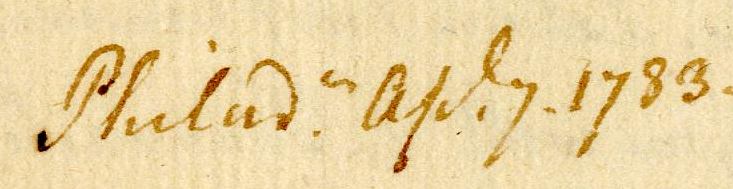Philad^a. Ap^l.7. 1783
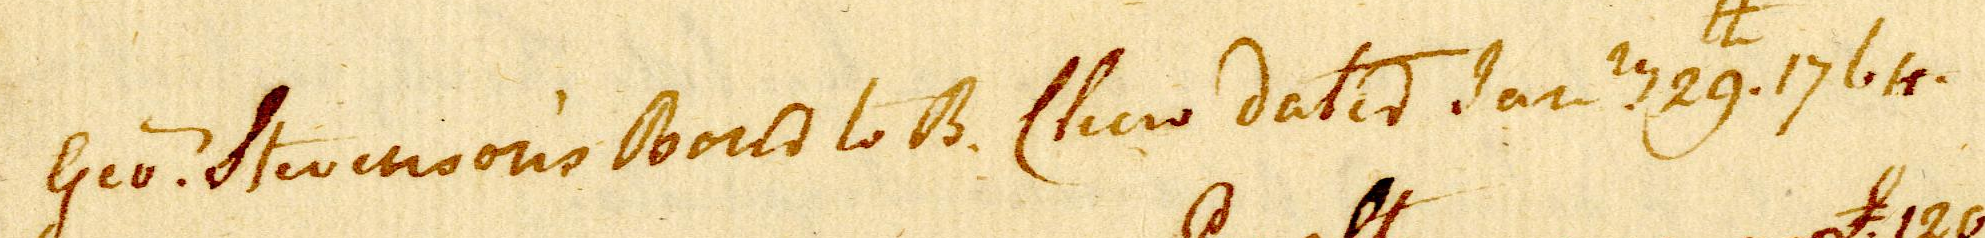Geo. Stevenson's Bond to B. Chew dated Jan^ y 29^th. 1764.
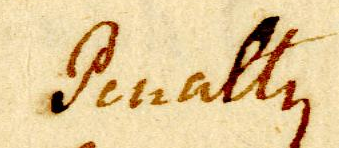Penalty
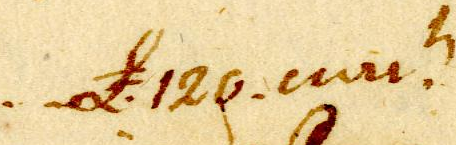£120. cure^t
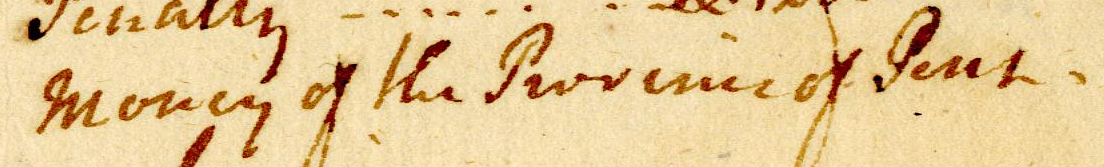Money of the Province of Pens-
